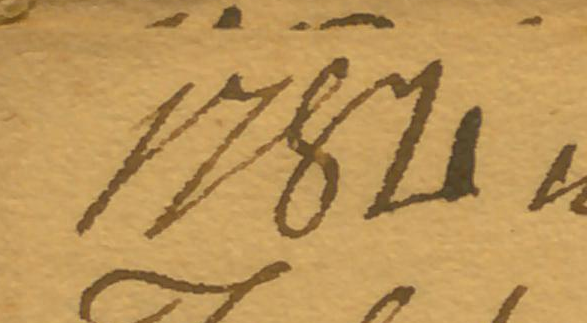1784
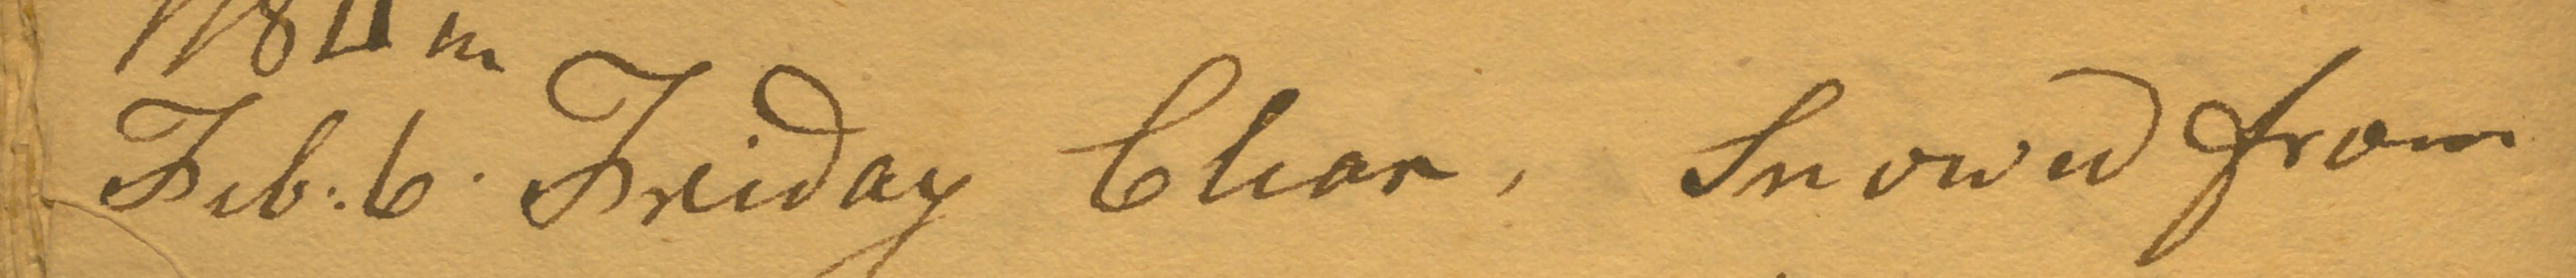Feb: 6^th. Friday Clear, Snowed from
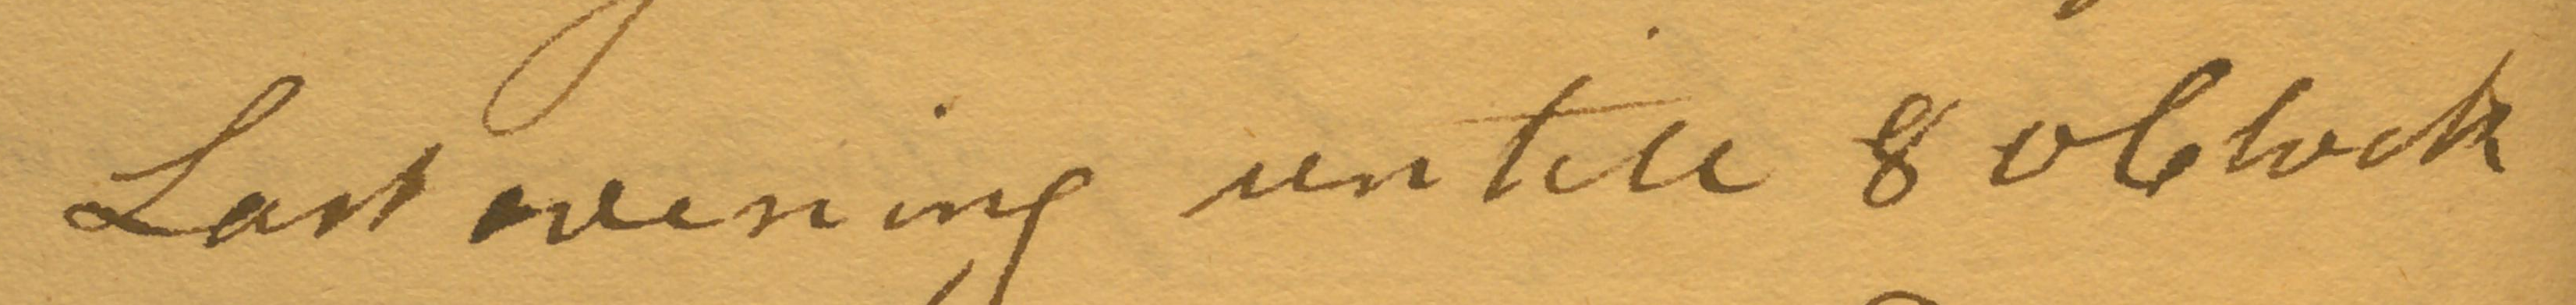Last ovening untill 8 oClock
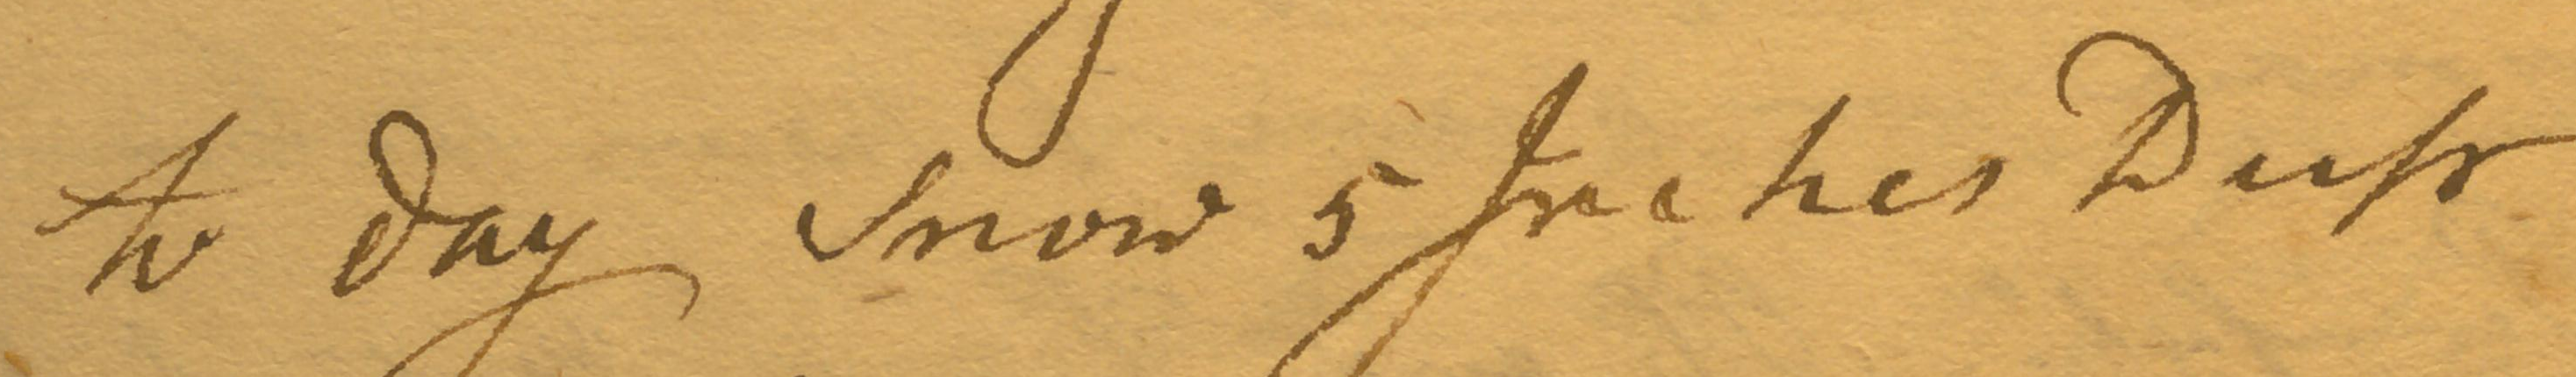to day Snow 5 Inches Deep
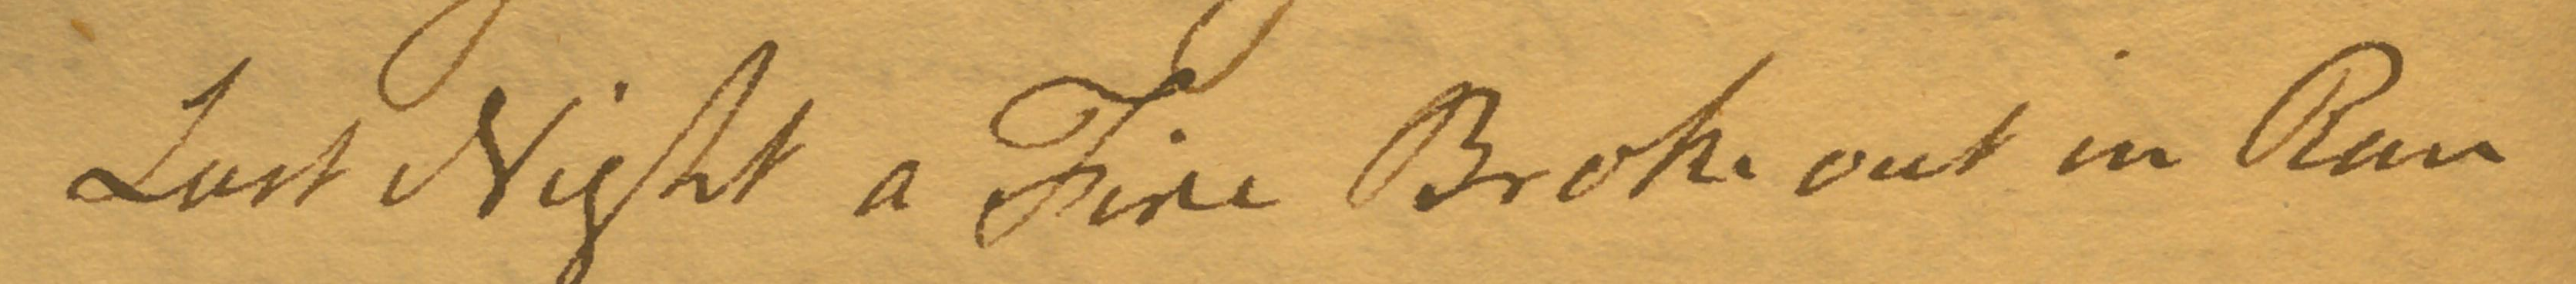Last Night a Fire Broke out in Race
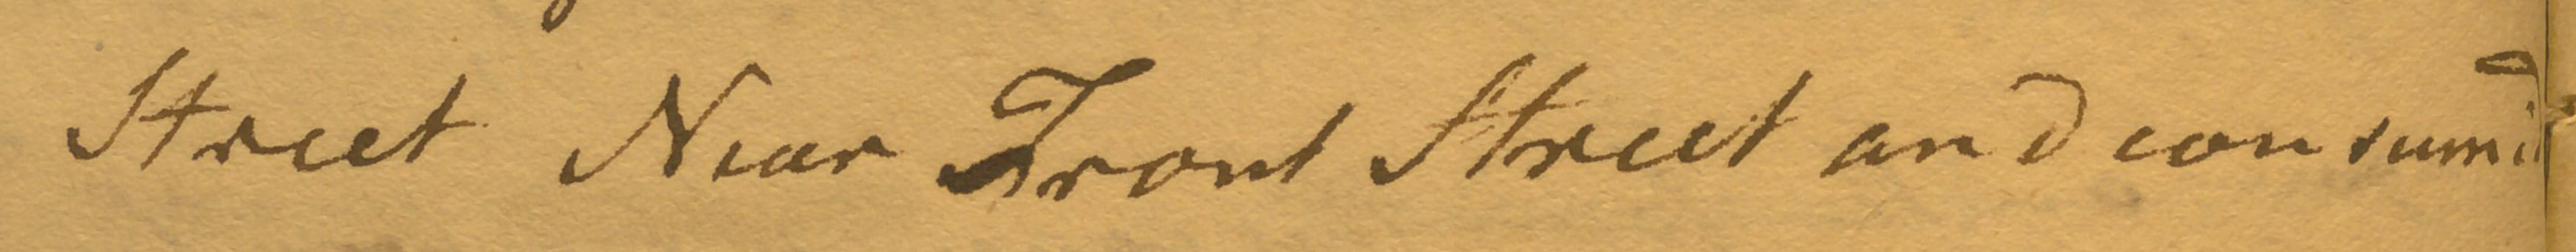Street Near Front Street and consumd
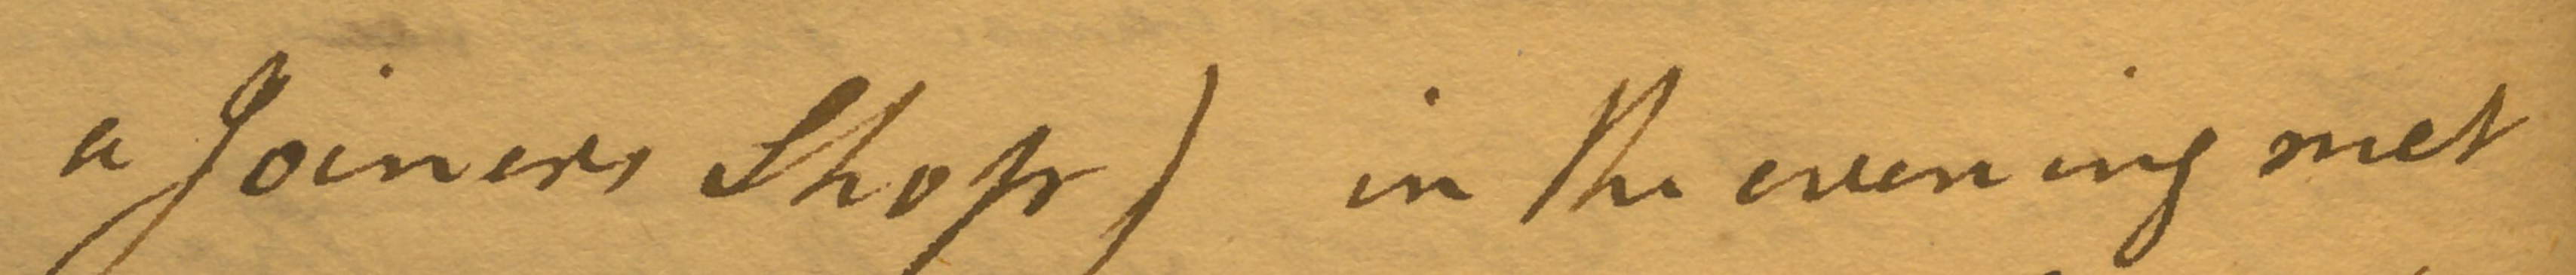a Joiners Shop) in the evening met
